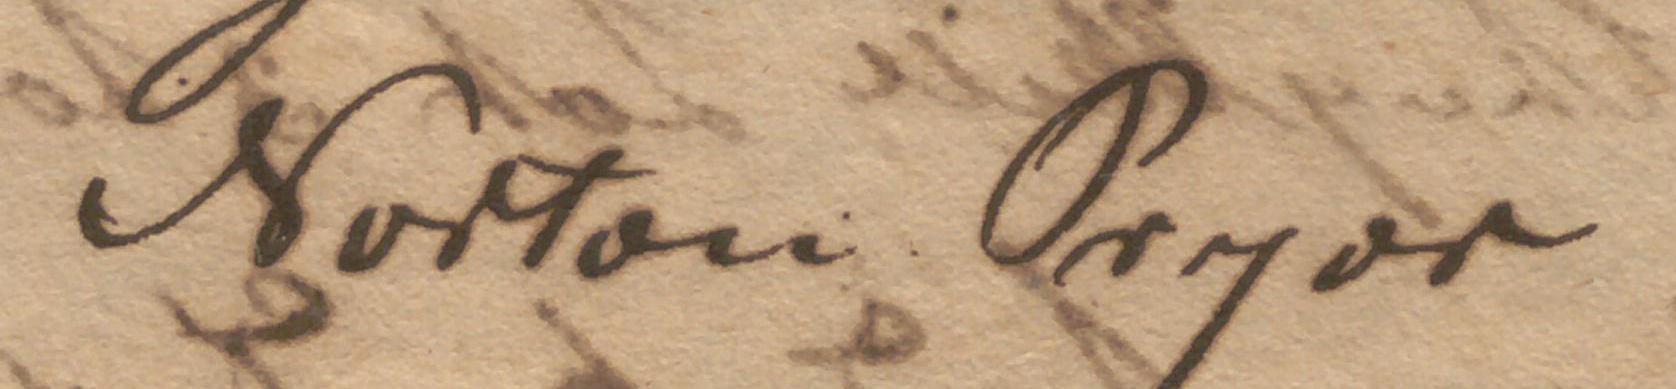Norton Pryor
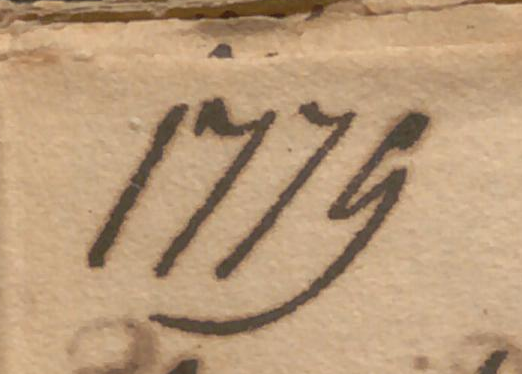1779
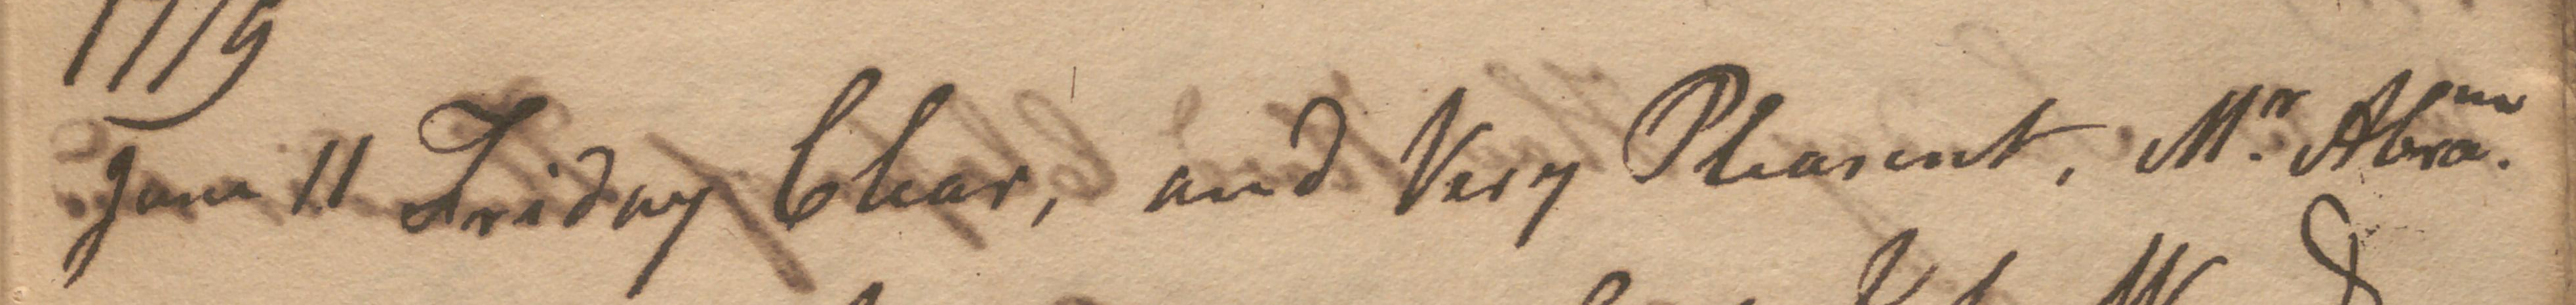June 11 Friday Clear, and Very Pleasent, M^r. Abra^m.
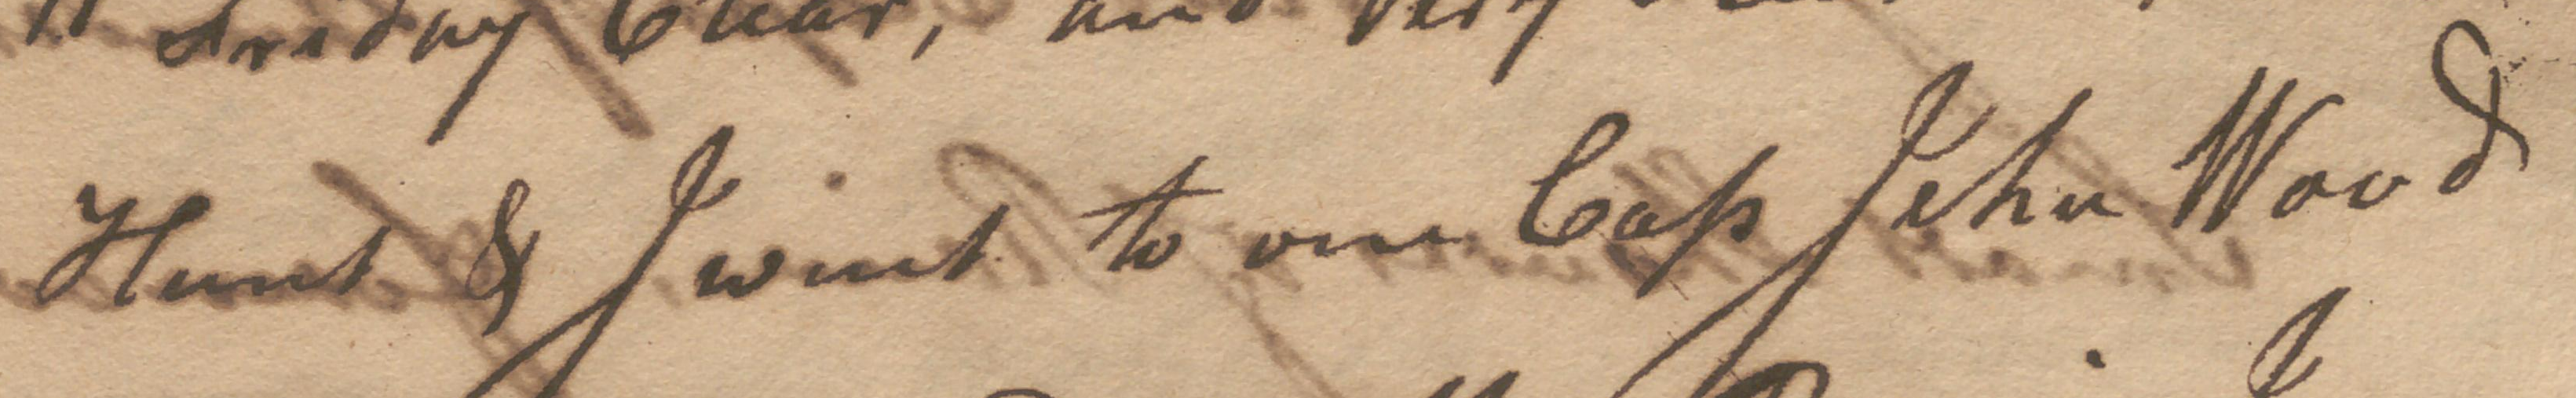Hunt & I went to one Cap Jehu Wood
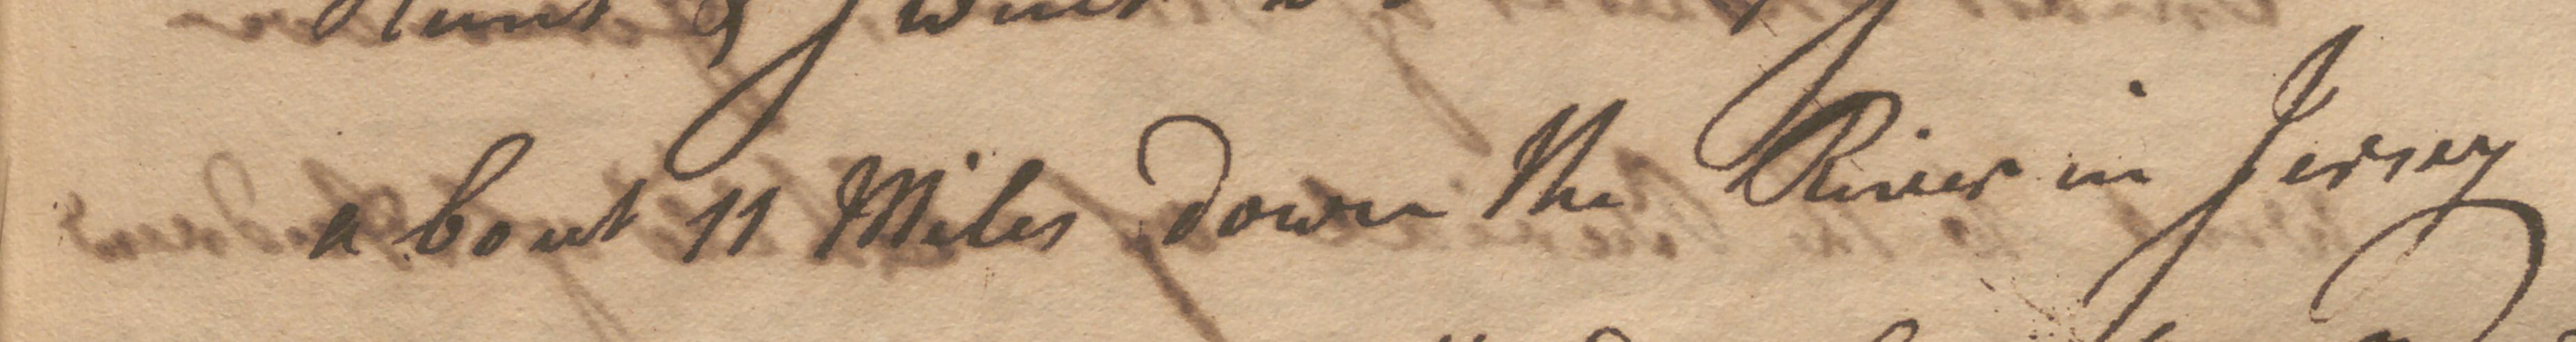about 11 Miles down the River in Jersey
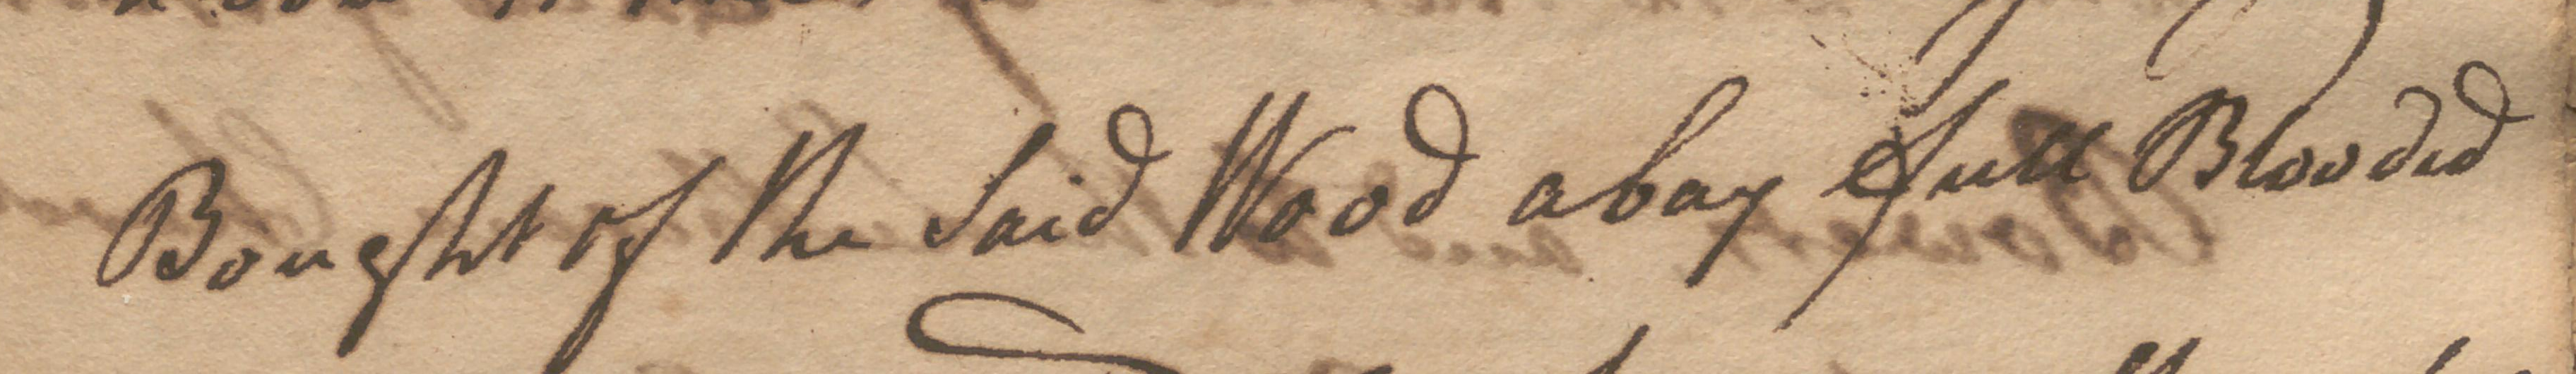Bought of the Said Wood a bay full Blooded
